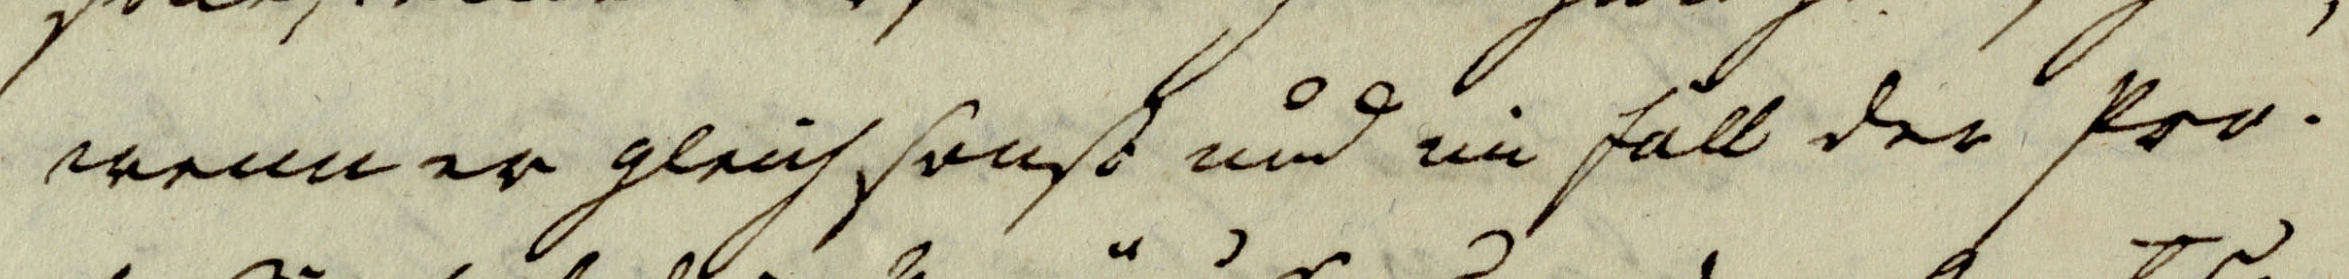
wenn er gleich sonst und in Fall der Pro¬
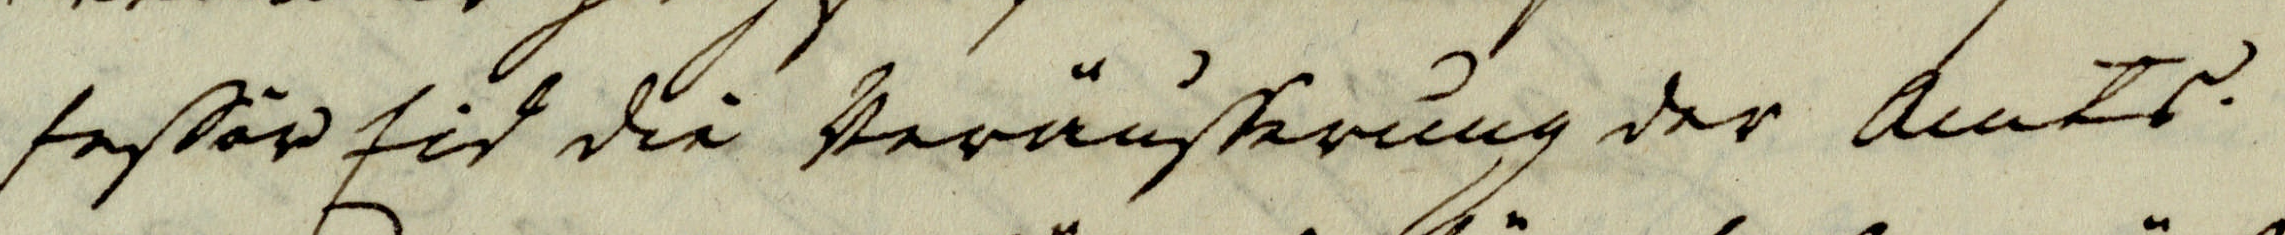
tessor Eid die Veräusserung der Amts¬
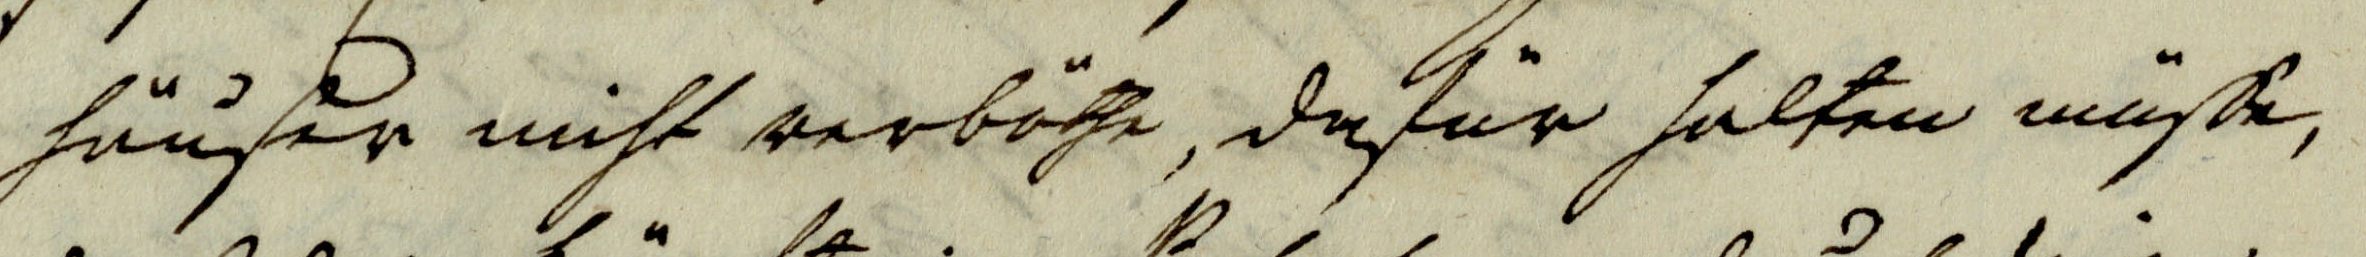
häuser nicht verböthe, dafür halten müsse,
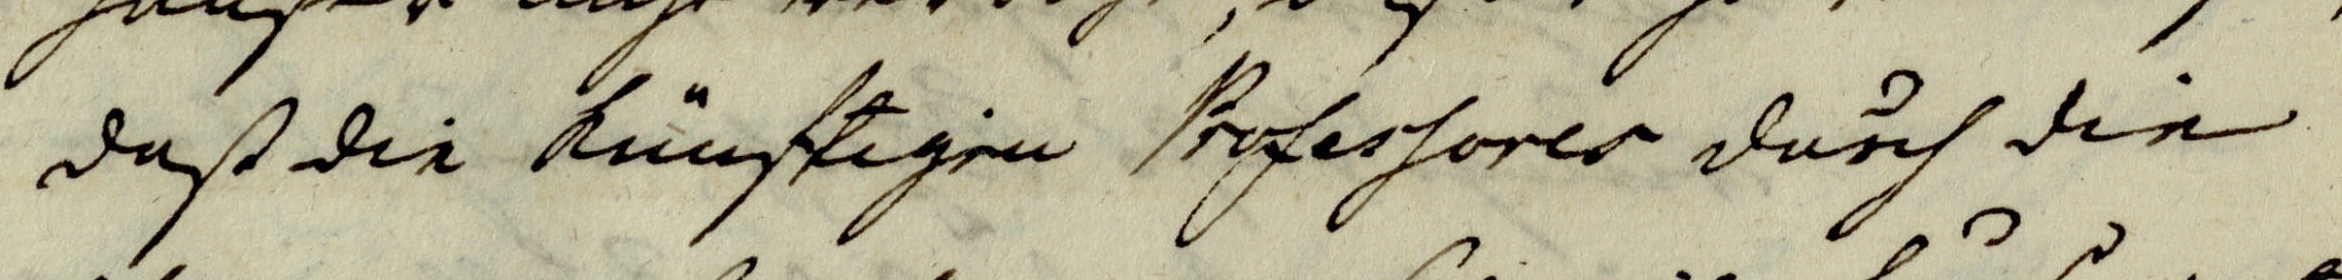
daß die künftigen Professores durch die
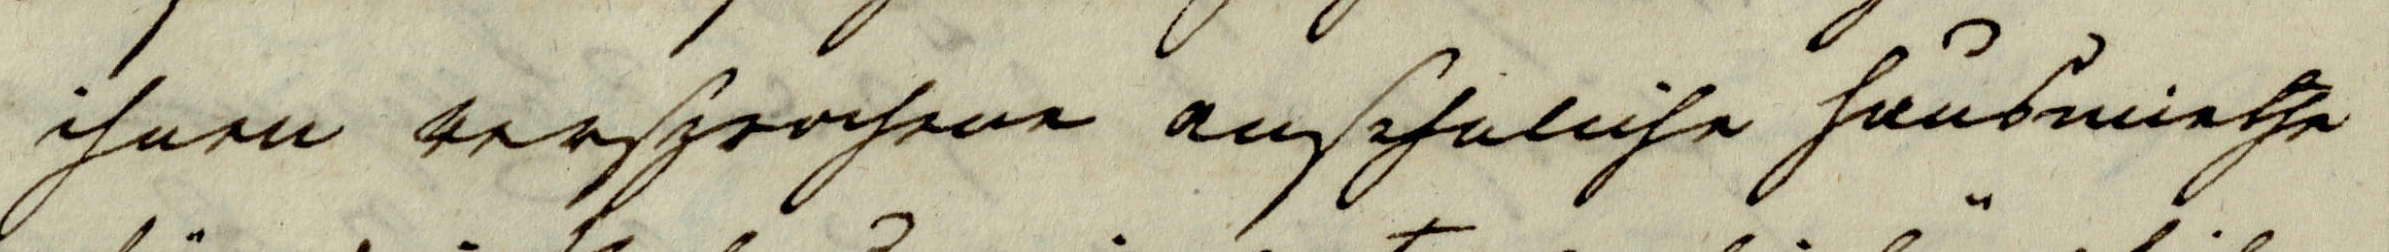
ihnen versprochene ansehnliche Hausmiethe
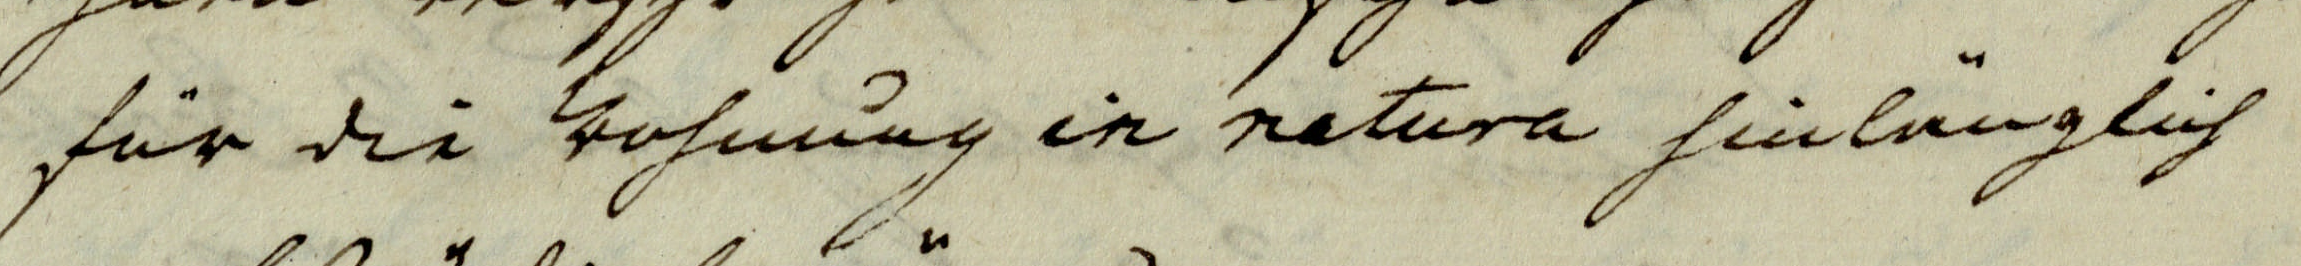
für die Wohnung in natura hinlänglich
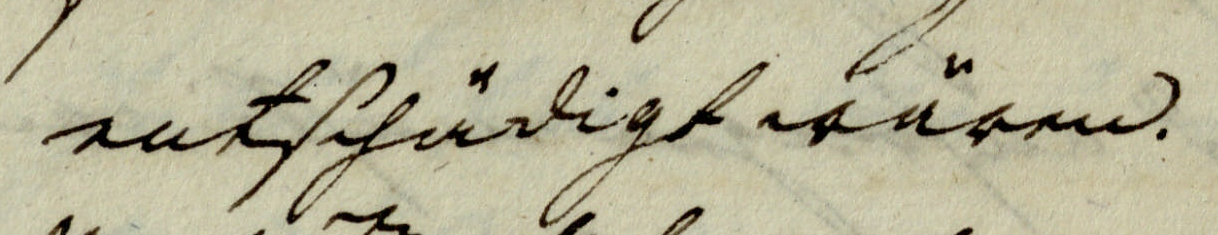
entschädigt wären.
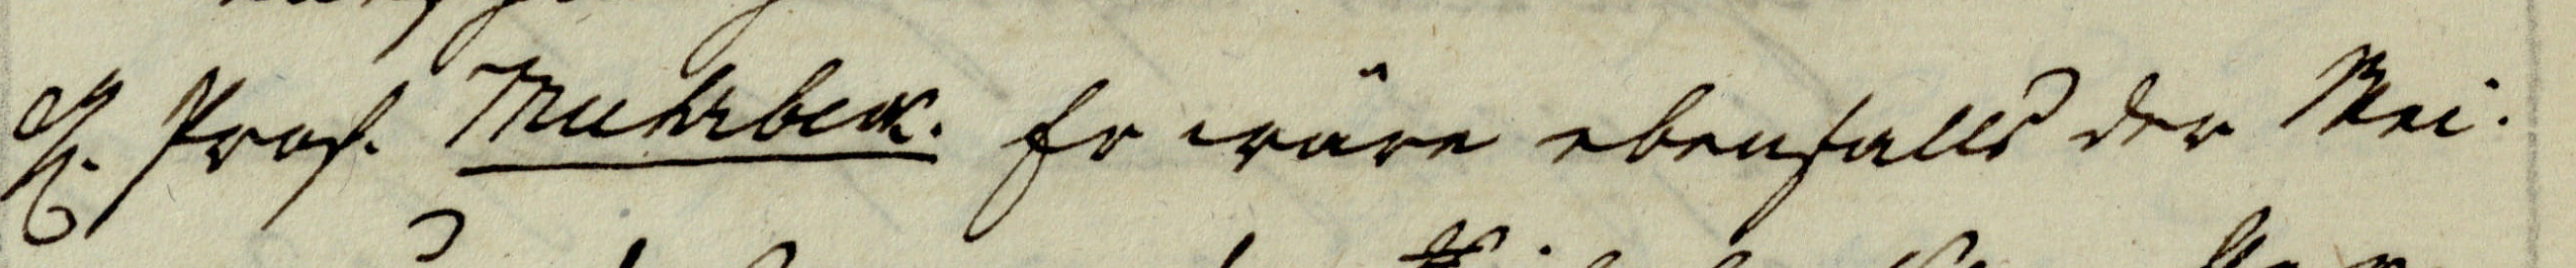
dh. Prof. Muhrbeck. Er wäre ebenfalls der Mei¬
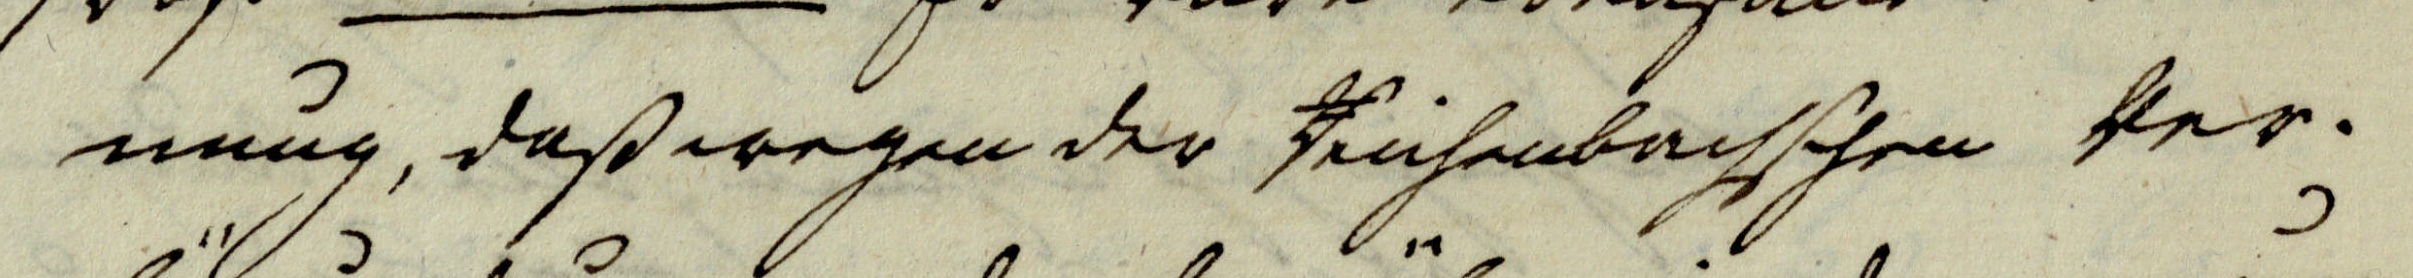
nung, daß wegen der Reichenbachschen Ver¬
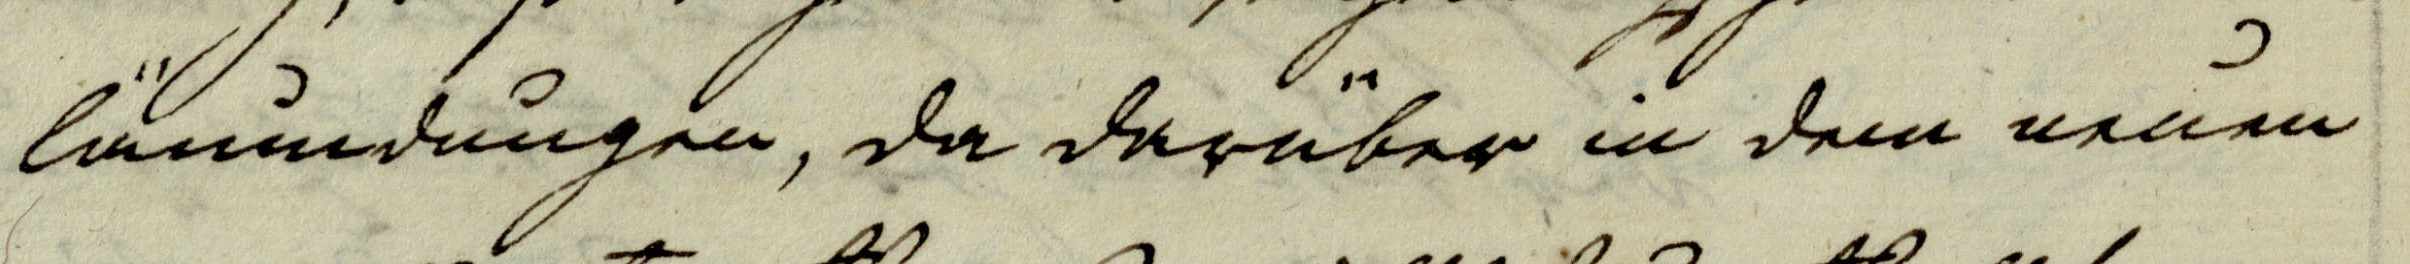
läumdungen, da darüber in dem neuen
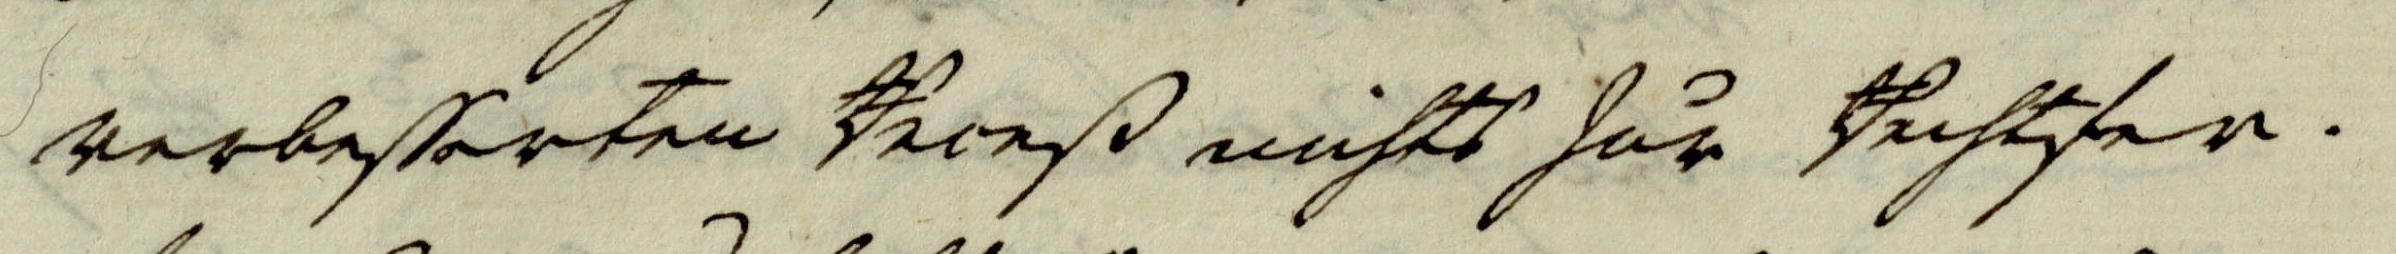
verbesserten Receß nichts zur Rechtfer¬
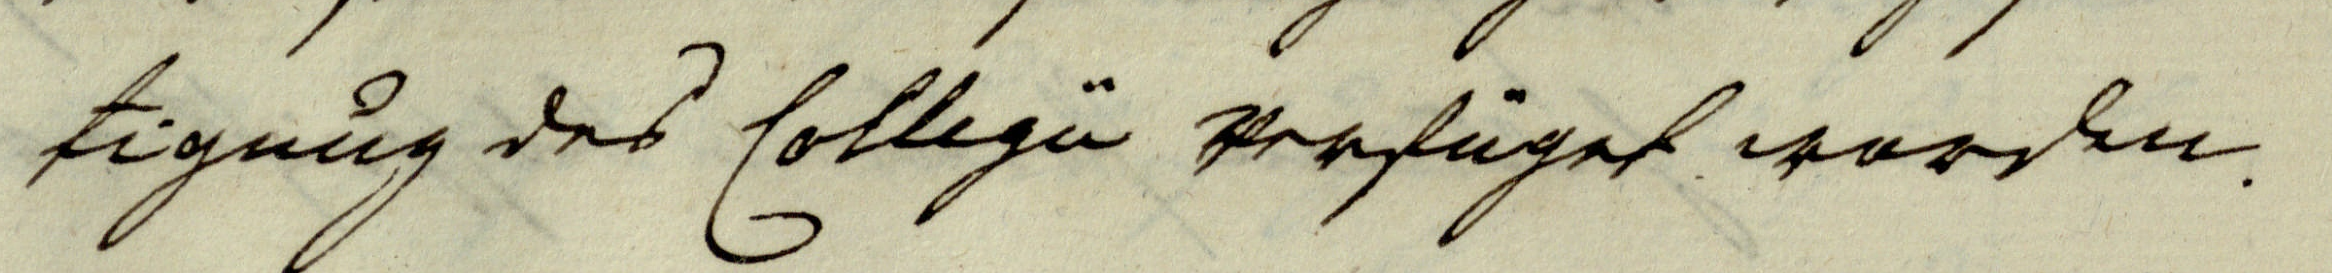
tigung des Collegii verfüget worden,
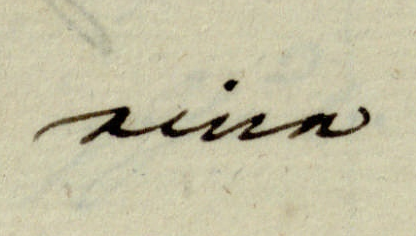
eine
